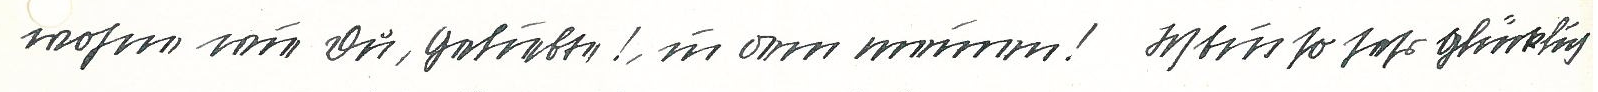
wohne wie Du, Geliebte!, in dem meinen! Ich bin so sehr glücklich
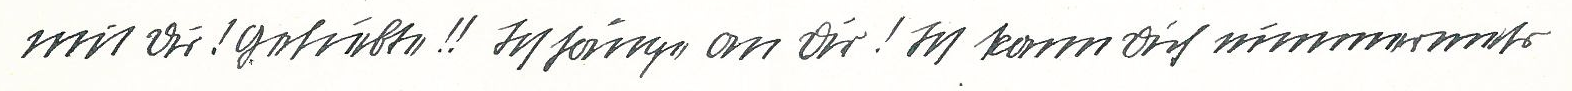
mit Dir! Geliebte!! Ich hänge an Dir! Ich kann Dich nimmermehr
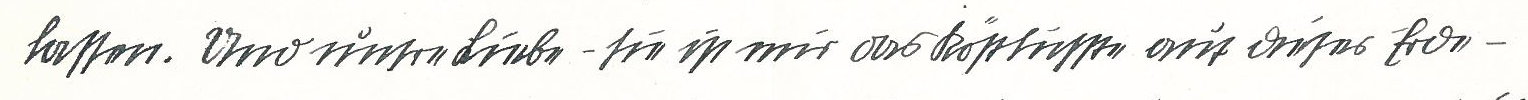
lassen. Und uns[e]re Liebe – sie ist mir das Köstlichste auf dieser Erde –
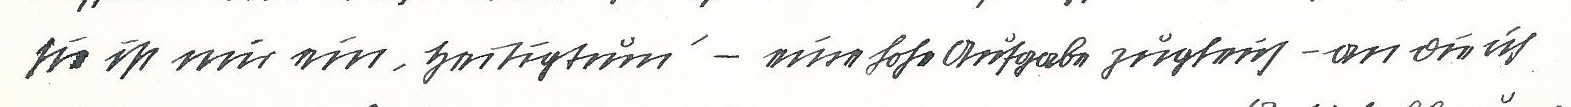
sie ist mir ein ,Heiligtum´– eine hohe Aufgabe zugleich – an die ich
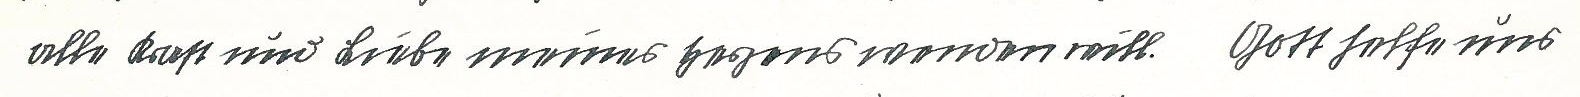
alle Kraft und Liebe meines Herzens wenden will. Gott helfe uns
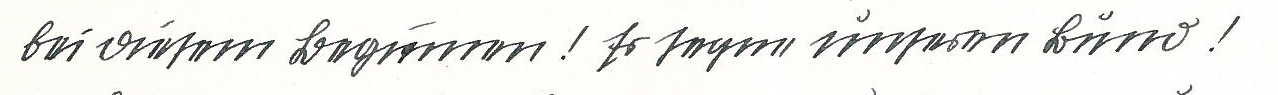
bei diesem Beginnen! Er segne unseren Bund!
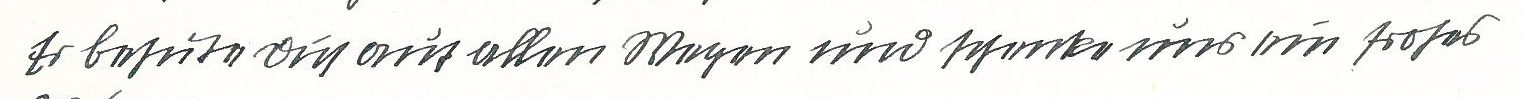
Er behüte Dich auf allen Wegen und schenke uns ein frohes
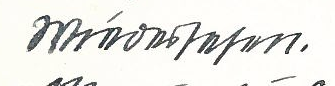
Wiedersehen.
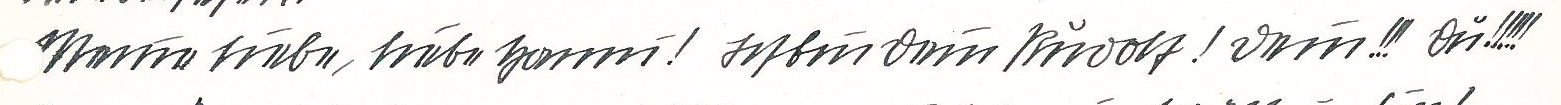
Meine liebe, liebe! Ich bin Dein! Dein!!! Du!!!!!
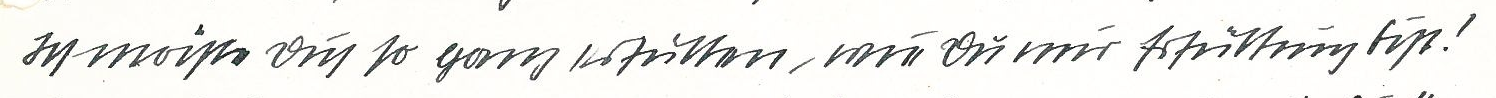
Ich möchte Dich so ganz erfüllen, wie Du mir Erfüllung bist!
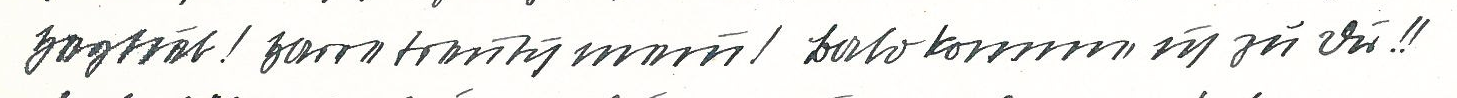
Herzlieb! Harre treulich mein! Bald komme ich zu Dir!!
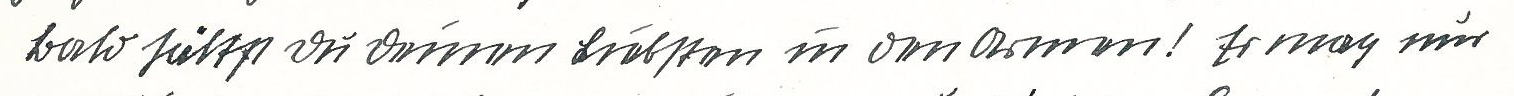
Bald hältst Du Deinen Liebsten in den Armen! Er mag nur
